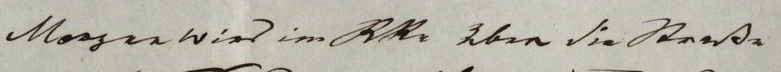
Morgen wird im RRe über die Straße
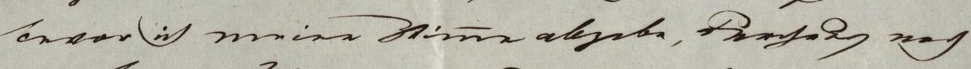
bevor ich meine Stimme abgebe, durchaus noch
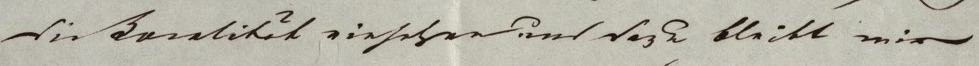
die Localität einsehen und dazu bleibt mir
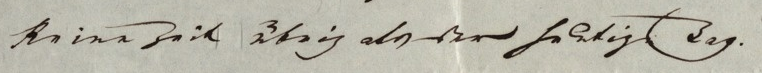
keine Zeit übrig als der heutige Tag.
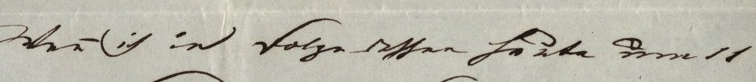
Wenn ich in Folge dessen heute um 11
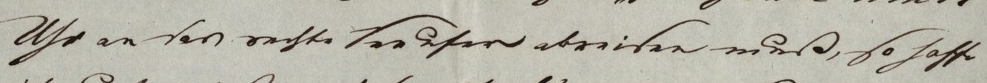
Uhr an das rechte Seeufer abreisen muß, so hoffe
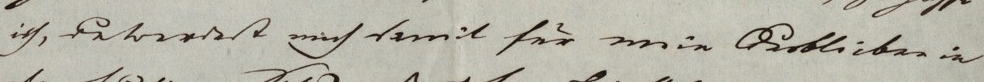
ich, Du werdest mich damit für mein Ausbleiben in
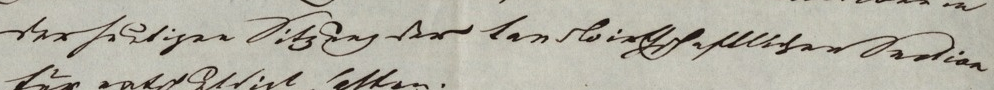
der heutigen Sitzung der landwirthschaftlichen Section
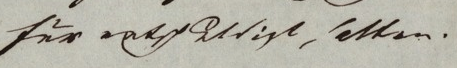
für entschuldigt halten.
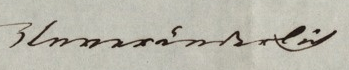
Unveränderlich
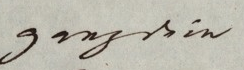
ganz Dein
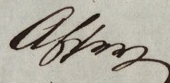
A Escher
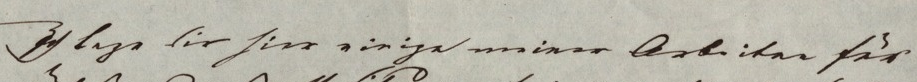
Ich lege dir hier einige meiner Arbeiten für
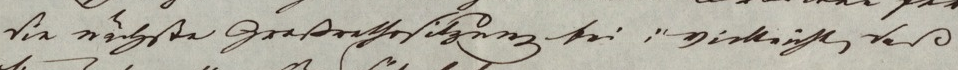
die nächste Großrathssitzung bei: Vielleicht, daß
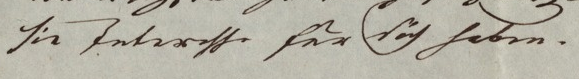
sie Interesse für dich haben.
